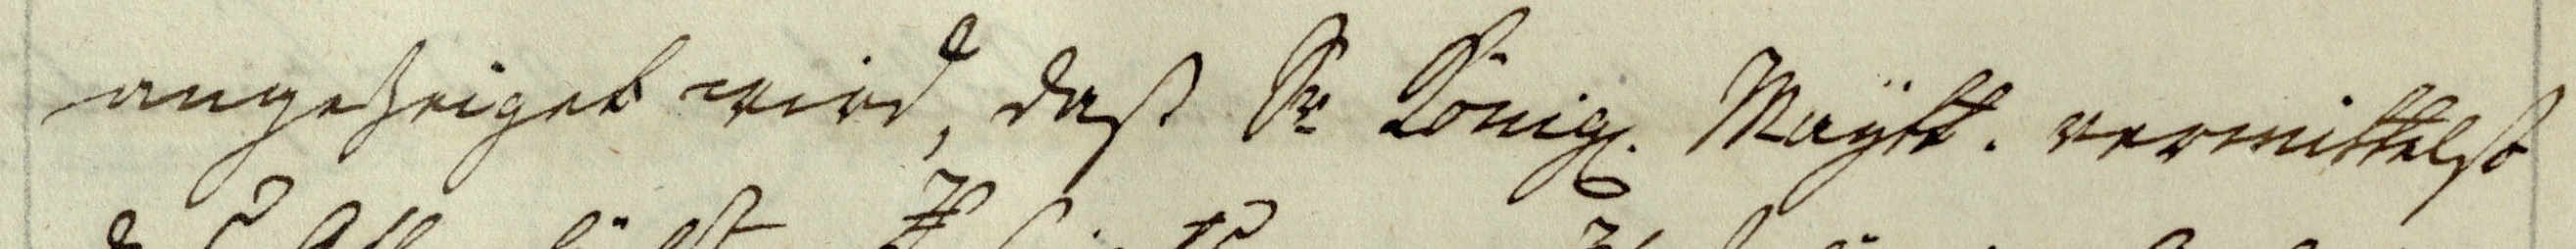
angezeiget wird, daß Sr. Königl. Maÿst. vermittelst
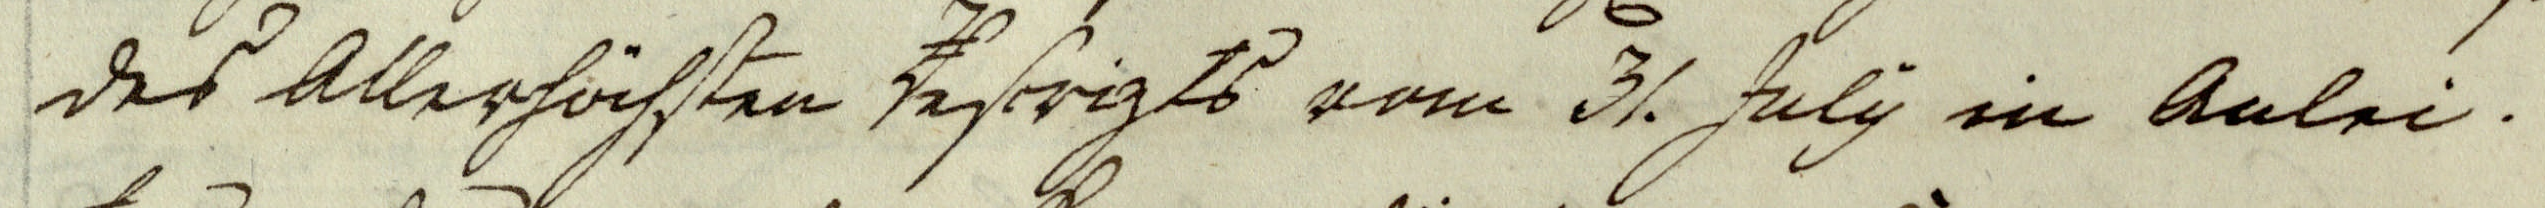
des Allerhöchsten Rescripts vom 31. Julÿ in Anlei¬
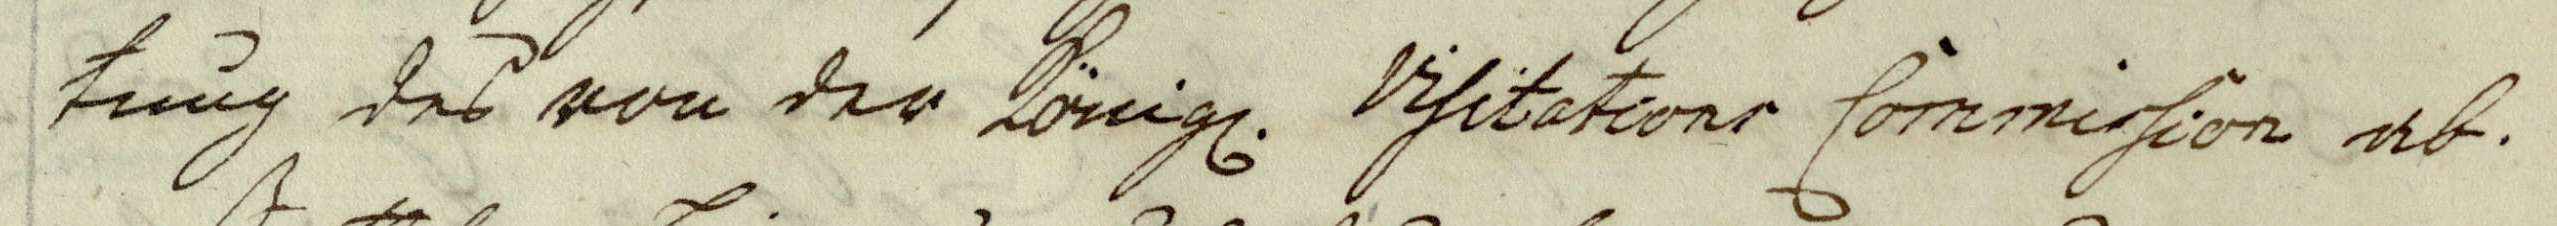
tung des von der Königl. Visitations Commission ab¬
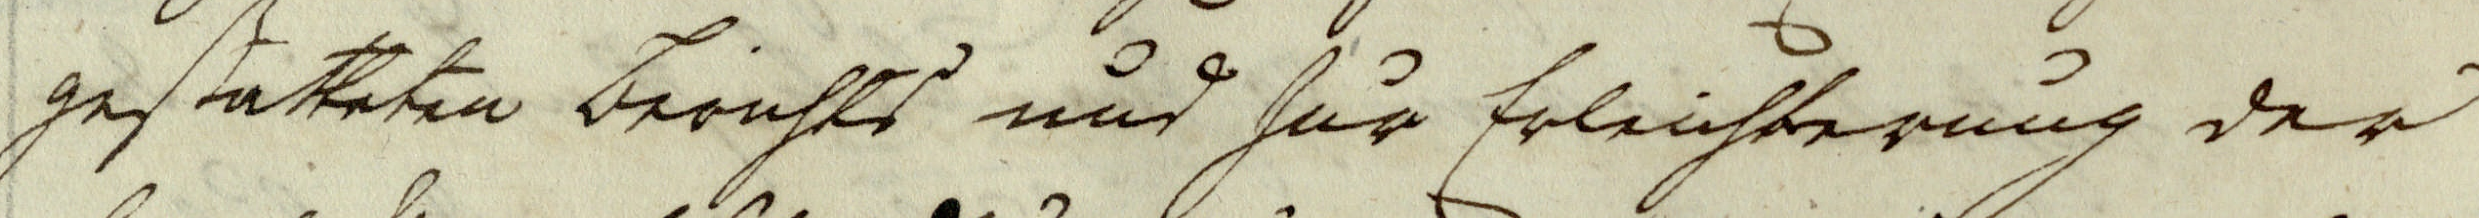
gestatteten Berichts und zur Erleichterung der
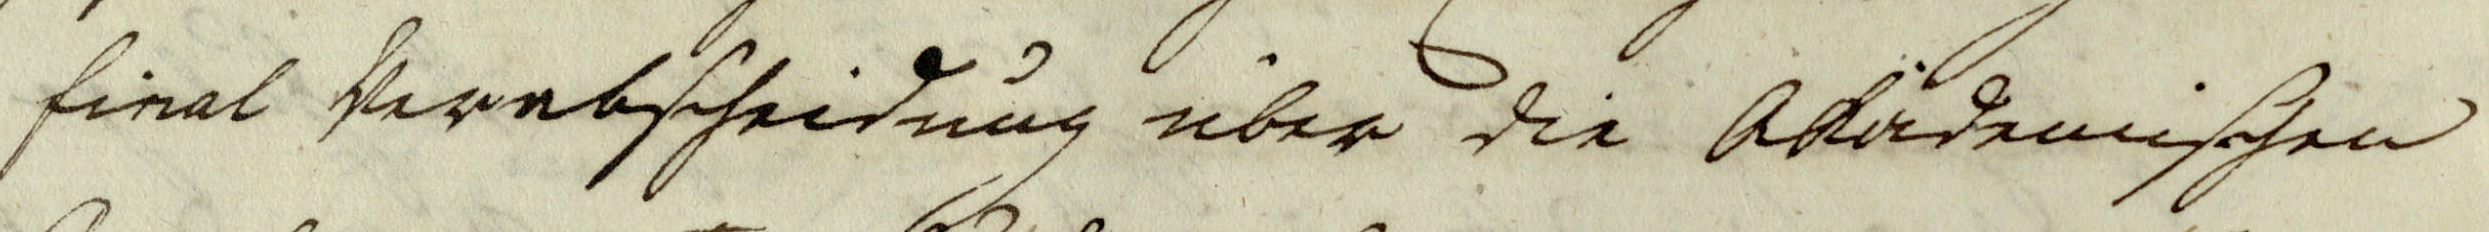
final Verabscheidung über die Akademischen
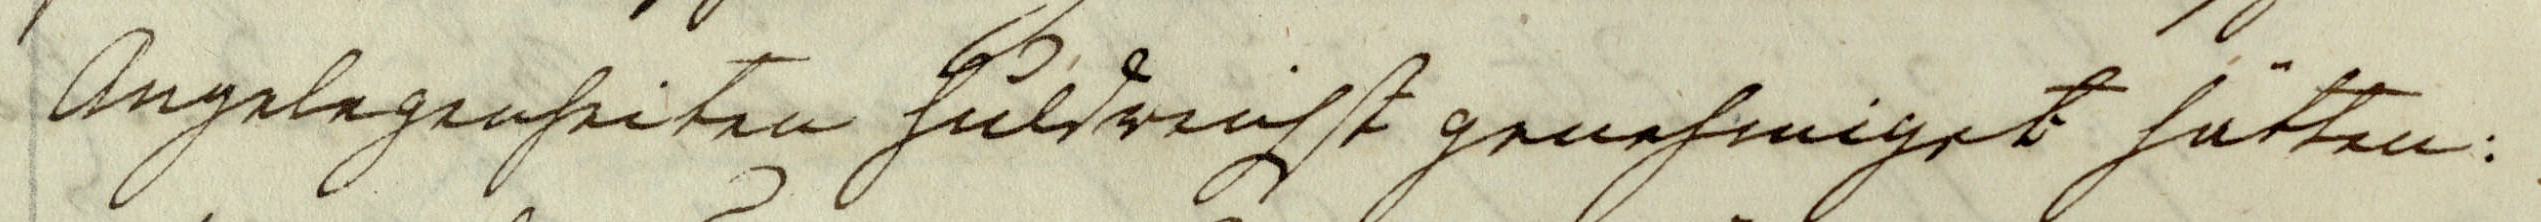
Angelegenheiten huldreichst genehmiget hätten:
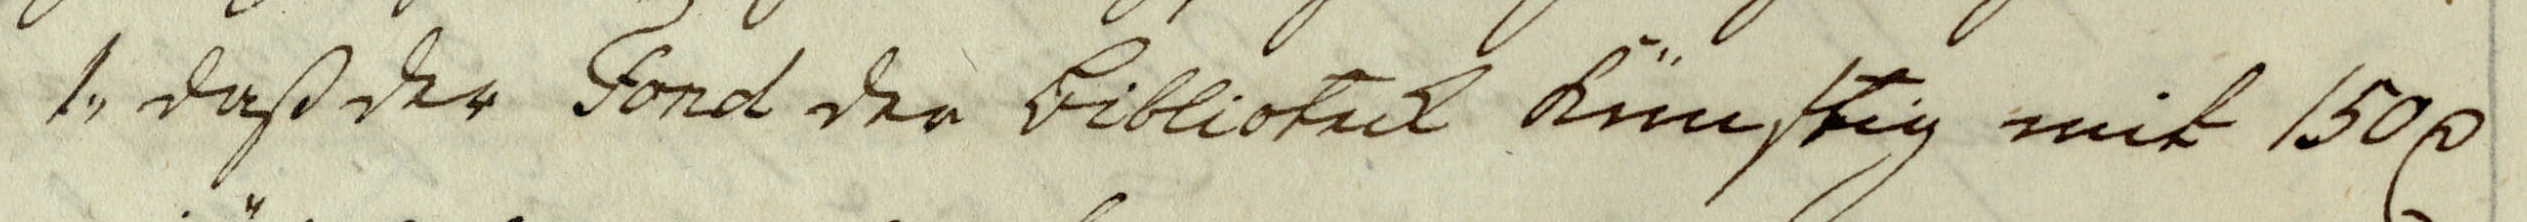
1., daß der Fond der Bibliotek künftig mit 150 rtl
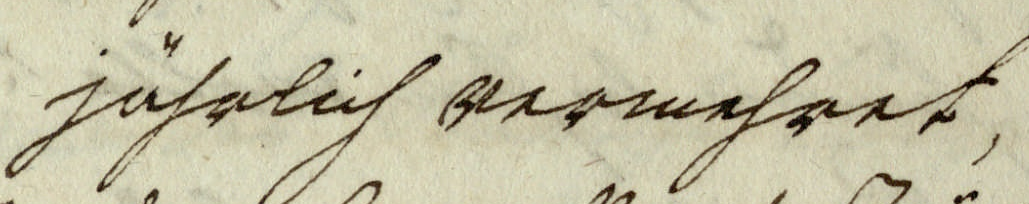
jährlich vermehrt,
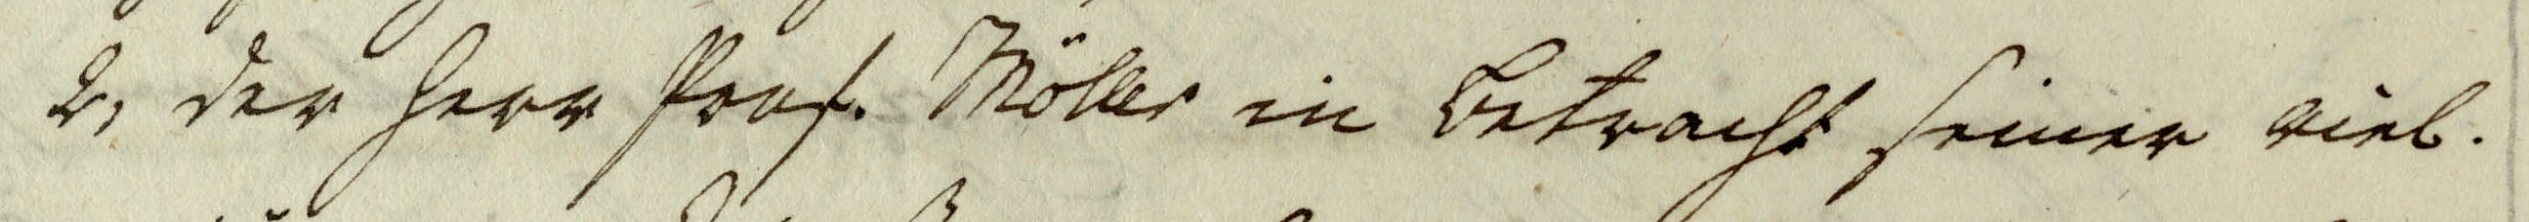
2., der Herr Prof. Möller in Betracht seiner viel¬
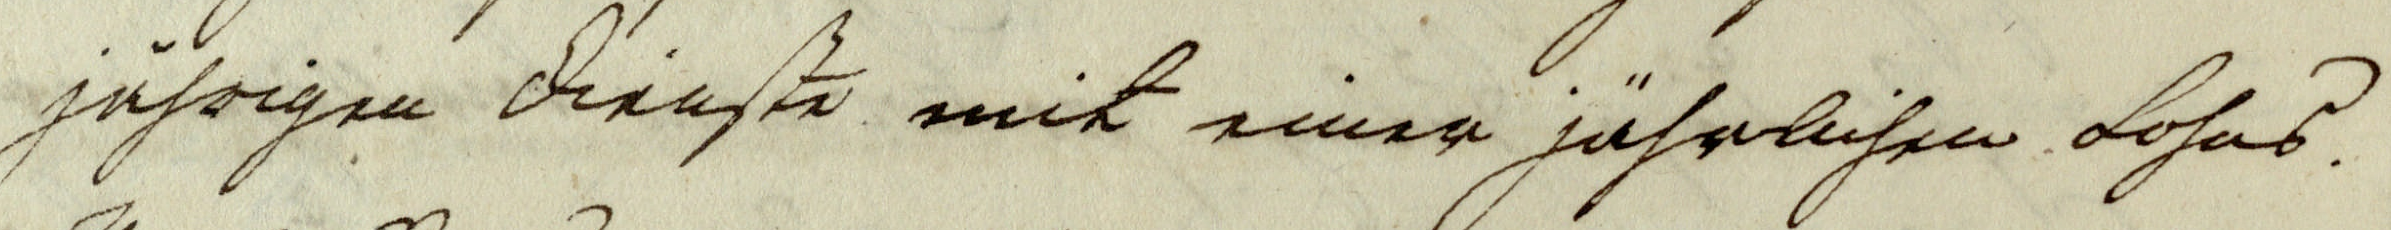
jährigen Dienste mit einer jährlichen Lohns¬
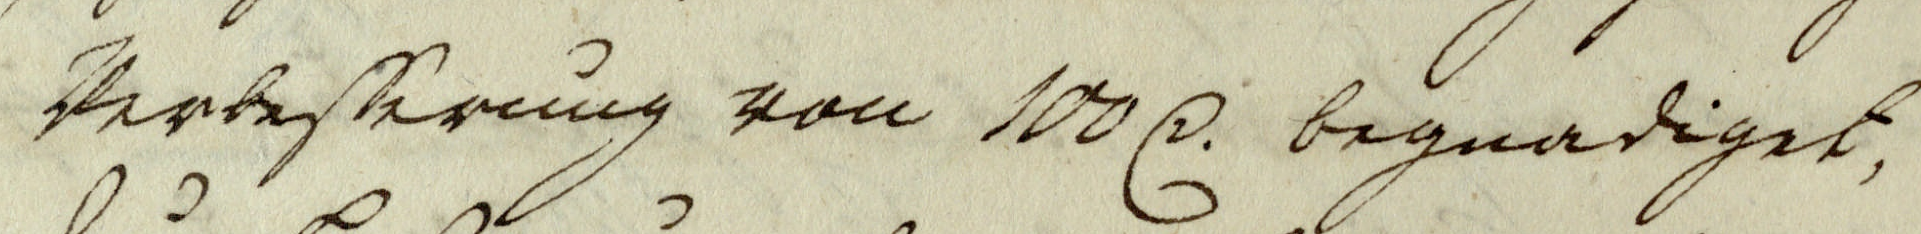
Verbesserung von 100 rtl begnadiget,
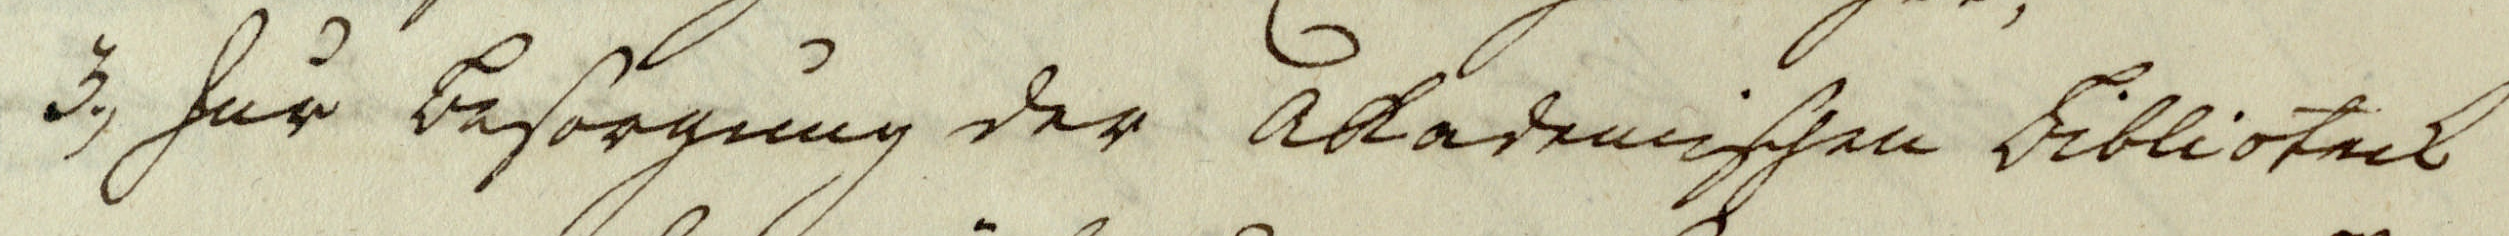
3., Zur Besorgung der Akademischen Bibliotek
